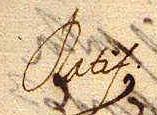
Ratif.
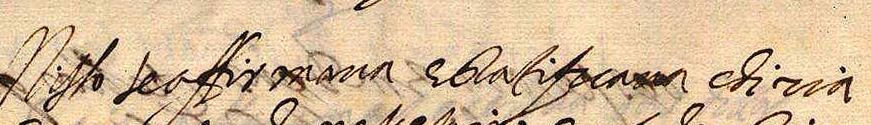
Nisso se affirmaua E Ratificaua e dizia
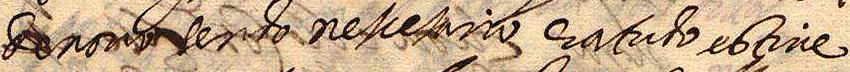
de nouo sendo nessesario E a tudo estiue
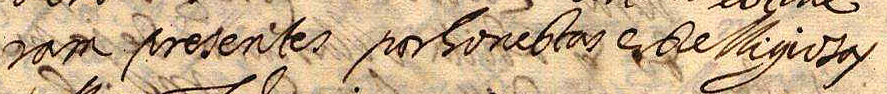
ram presentes por honestas e Relligiozas
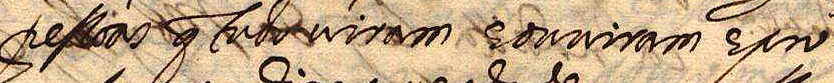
pessoas q̄ tudo uiram E ouuiram E pro
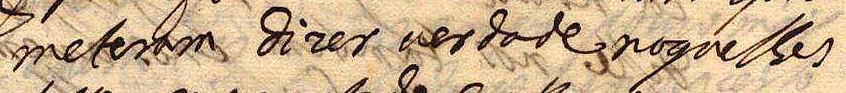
meteram dizer uerdade no que lhes
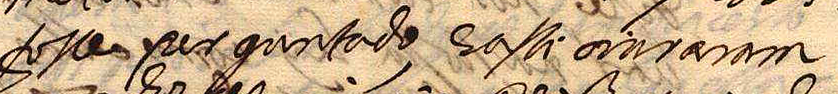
fosse perguntado, E assi o iuraram
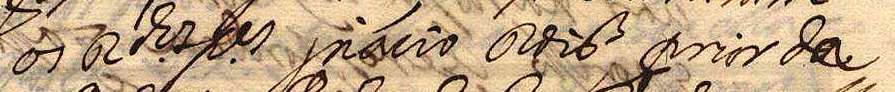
os Rdos. p.es jnacio Rois̄ prior da
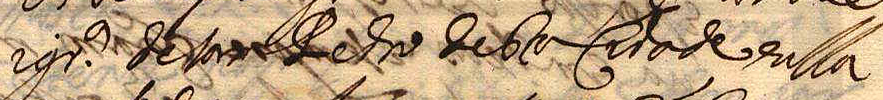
igr.a de sam Pedro desta Cidade E Ma
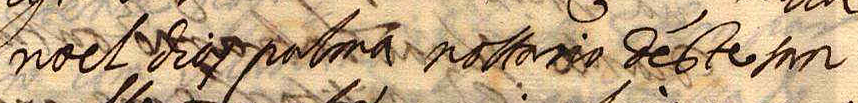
noel dias palma nottario deste san
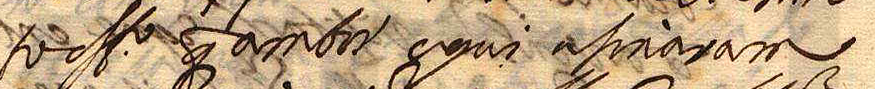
to off.o q̄ ambos aqui asinaram
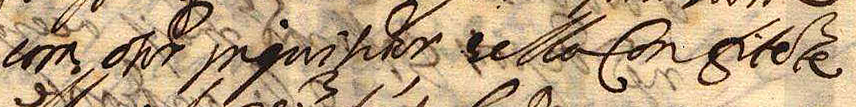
com o sor̄ jnquisidor E ella Confitēte
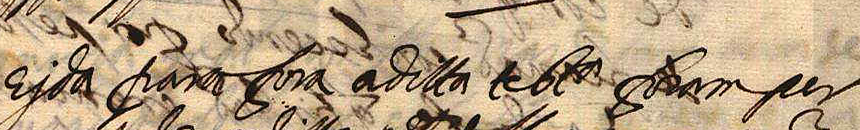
E ida para fora a ditta testa foram per
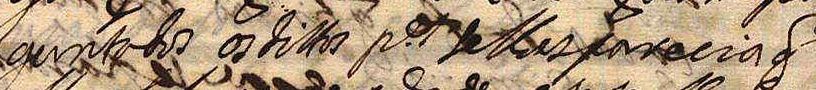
guntados os dittos p.es se lhes parecia q̄
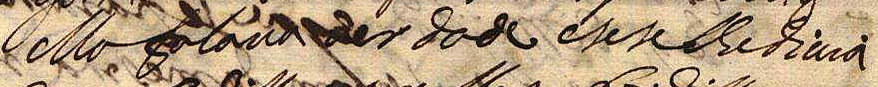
ella falaua verdade e se se lhe diuia
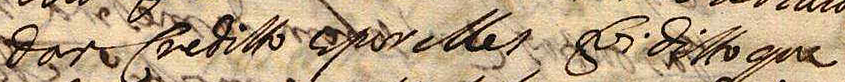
dar Creditto E por elles foi ditto que
